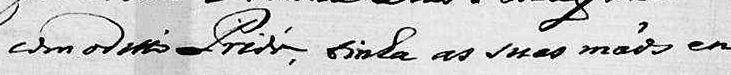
com o ditto Prior, tinha as suas maõs en
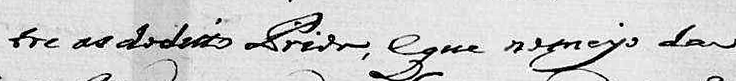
tre as do ditto Prior, e que no meyo da
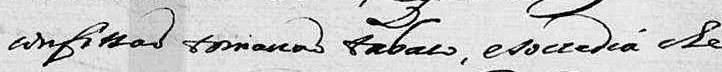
confissaõ tomauaõ tabaco, e soccedia che
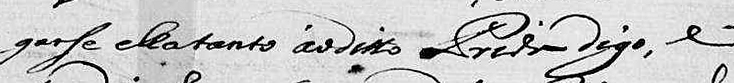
garse ella tanto ao ditto Prior digo, e
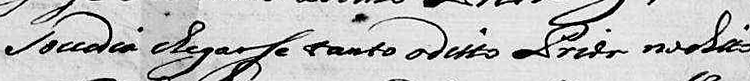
soccedia chegarse tanto o ditto Prior no ditto
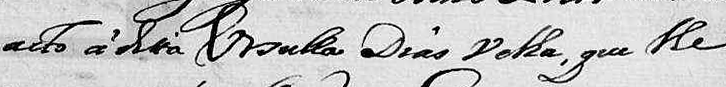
acto à ditta Ursulla Dias Velha, que lhe
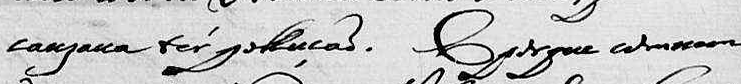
cauzaua ter polluçaõ. E porque comuem
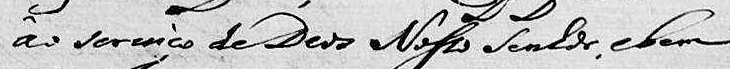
áo seruiço de Deos Nosso Senhor, e bem
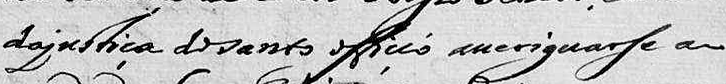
da justiça do santo officio aueriguarse a
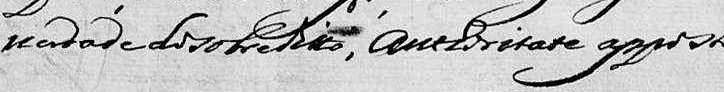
uerdade do sobreditto, authoritate apposto
